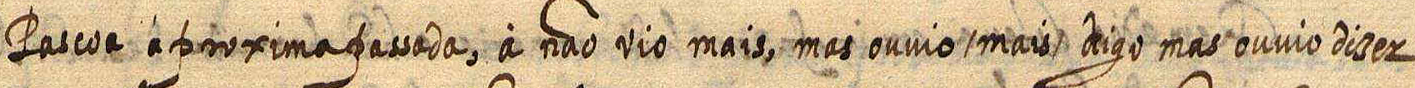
Pascoa a proxima passada, a não vio mais, mas ouuio / mais / digo mas ouuio dizer
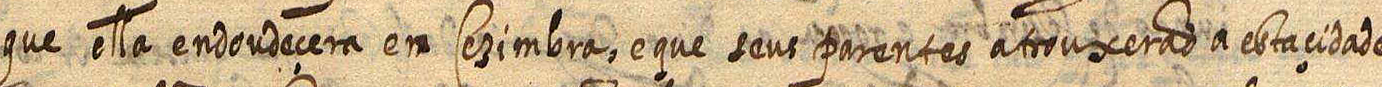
que ella endoudeçera em Cezimbra, e que seus parentes a trouxerão a esta çidade
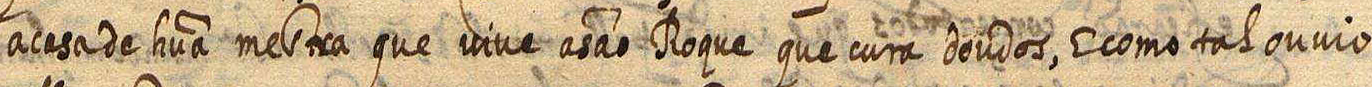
a casa de huā mestra que uiue a são Roque que cura doudos, E como tal ouuio
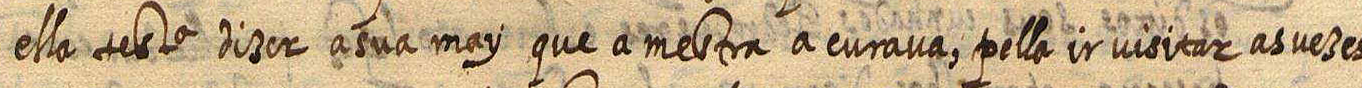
ella testa dizer a sua may que a mestra a curaua, pella ir uisitar as uezes
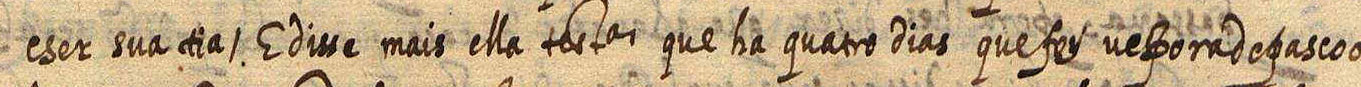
e ser sua tia / E disse mais ella testa que ha quatro dias que foy uespora de pascoa
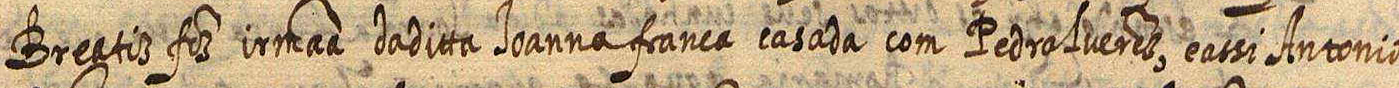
Breatiz frz̄ irmāa da ditta Ioanna franca casada com Pedraluerēz, e assi Antonio
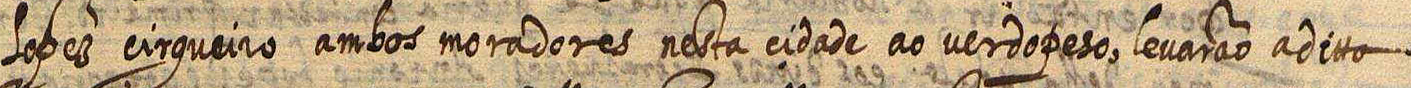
Lopez̄ cirgueiro ambos moradores nesta cidade ao uer do peso, leuarão a ditta
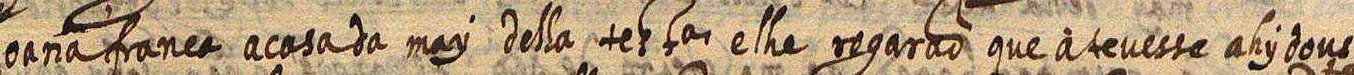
Joanna franca a casa da may della testa e lhe rogarão que a teuesse ahy dous
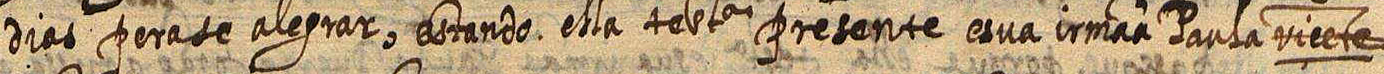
dias pera se alegrar, estando ella testa presente e sua irmāa Paula viçete
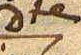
Dte
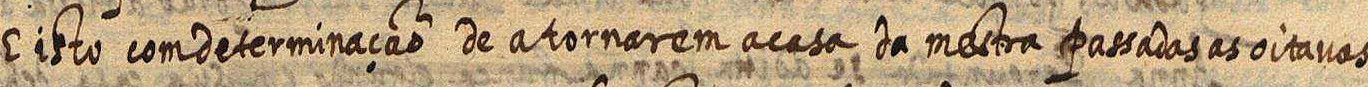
E isto com determinação de a tornarem a casa da mestra passadas as oitauas
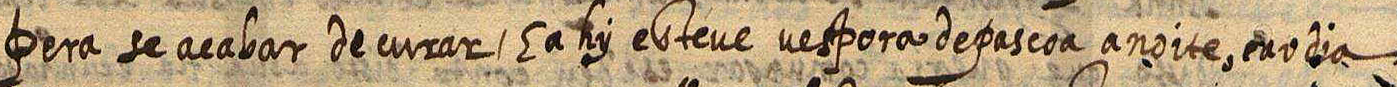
pera se acabar de curar / E ahy esteue uespora de pascoa a noite, e ao dia
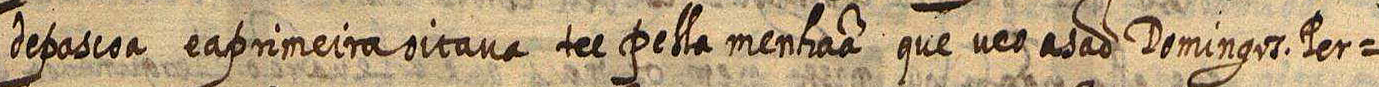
de pascoa e a primeira oitaua tee pella menhaā que veio a são Domingos. Per
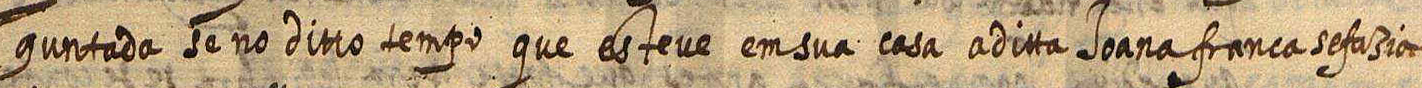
guntada se no ditto tempo que esteue em sua casa a ditta Ioanna franca se fazia
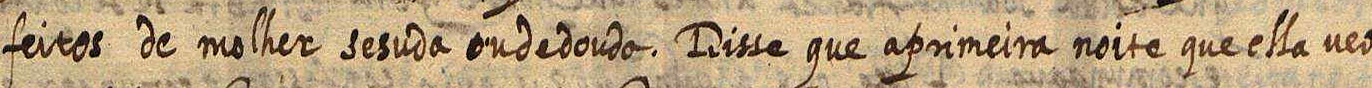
feitos de molher sesuda ou de douda. Disse que a primeira noite que ella ueo
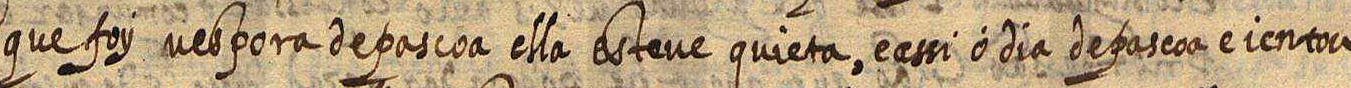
que foy uespora de pascoa ella esteue quieta, e assi o dia de pascoa e ientou
